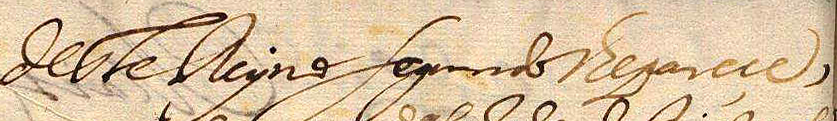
deste Reyno segundo lhe parece,
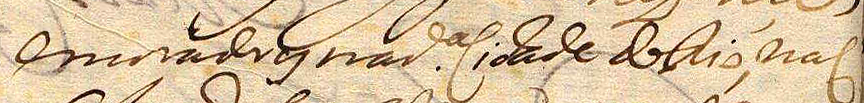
e moradres na d.a Cidade do Rio, nā
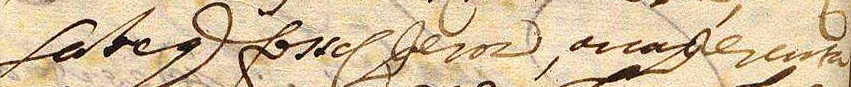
sabe q̄ fossē pRezoz, ou apresenta
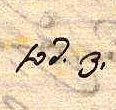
tod. 3.
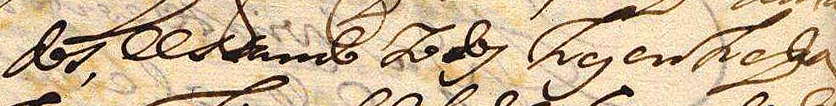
dos, e estando todos tres entre pRa
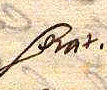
prat.
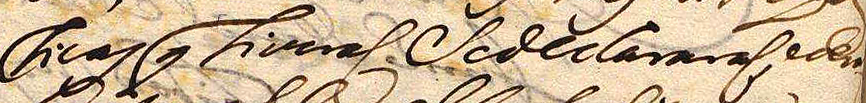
ticas q̄ tiverā se declararā e der
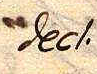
decl.
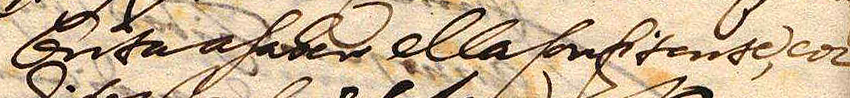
Conta a saber ella Confitente, e os
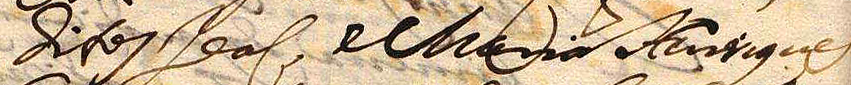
ditos Joā, e Maria Henriques
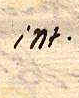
int.
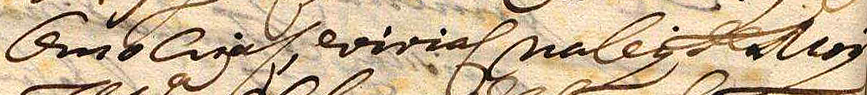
Como Criā, e viviā na lej de Moy
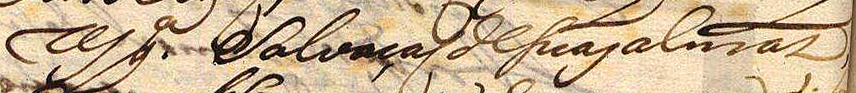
zes p.a Salvaçā de suas almaz,
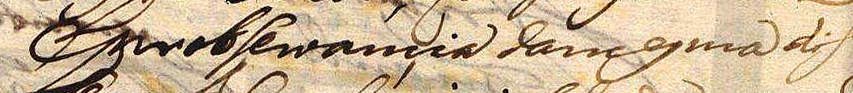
E por observancia da mesma dis
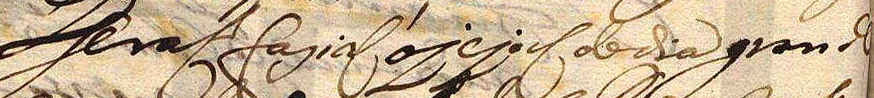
serā faziā o jejū do dia grande
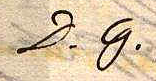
D. G.
